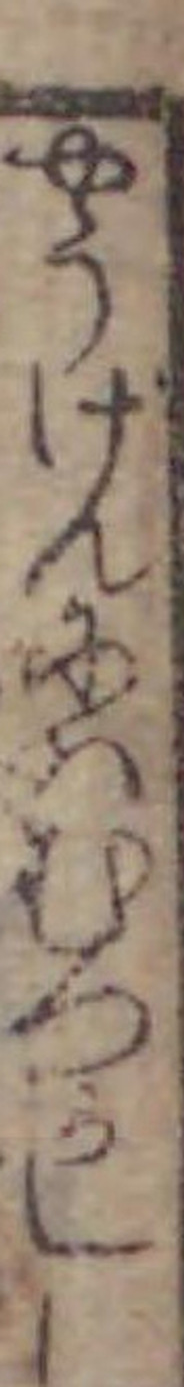やうけんにはむつかし
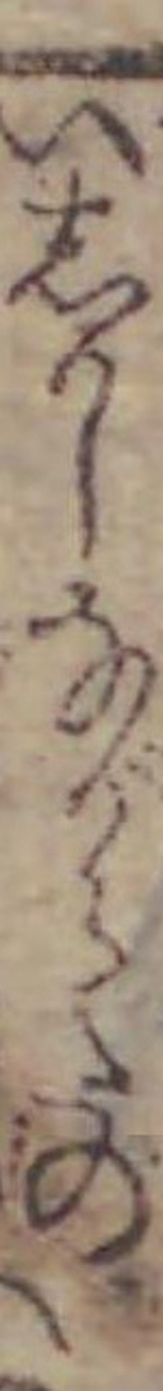いしかしながらたの
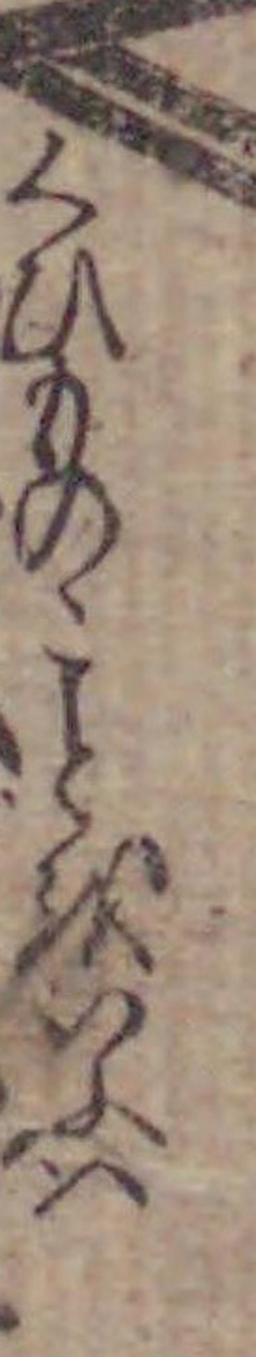くひものゝことをいふは
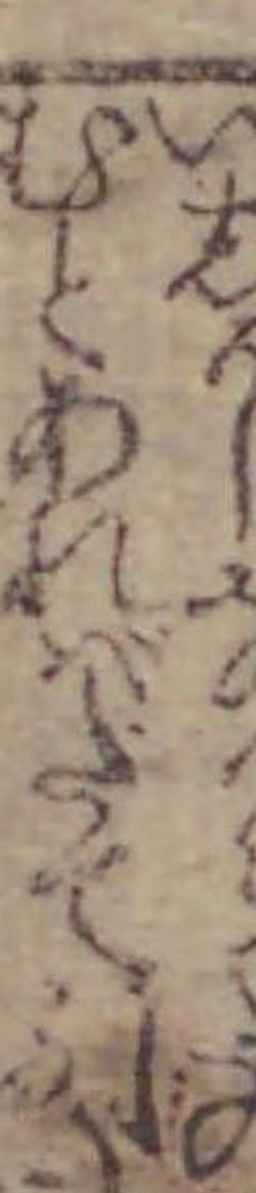むとあればたて引
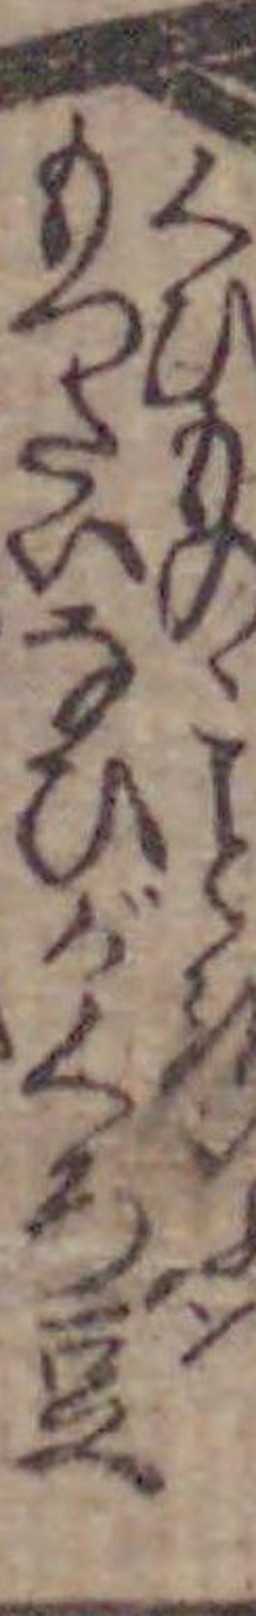もつたいなひがくろ豆
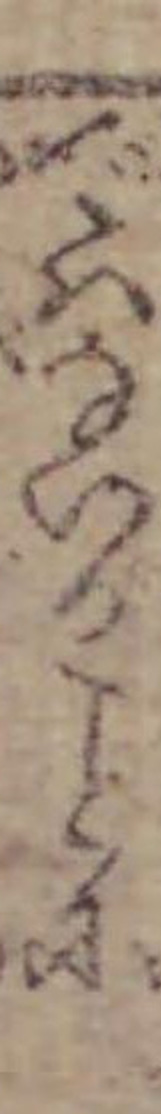ではないがことに
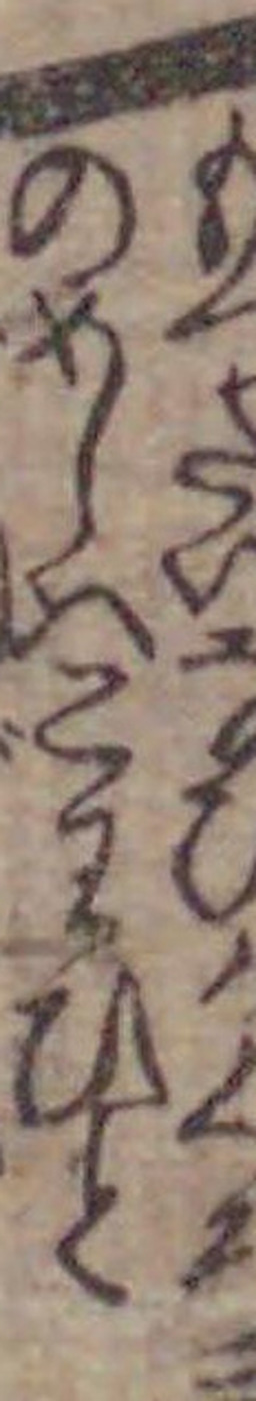のめしはこわひと
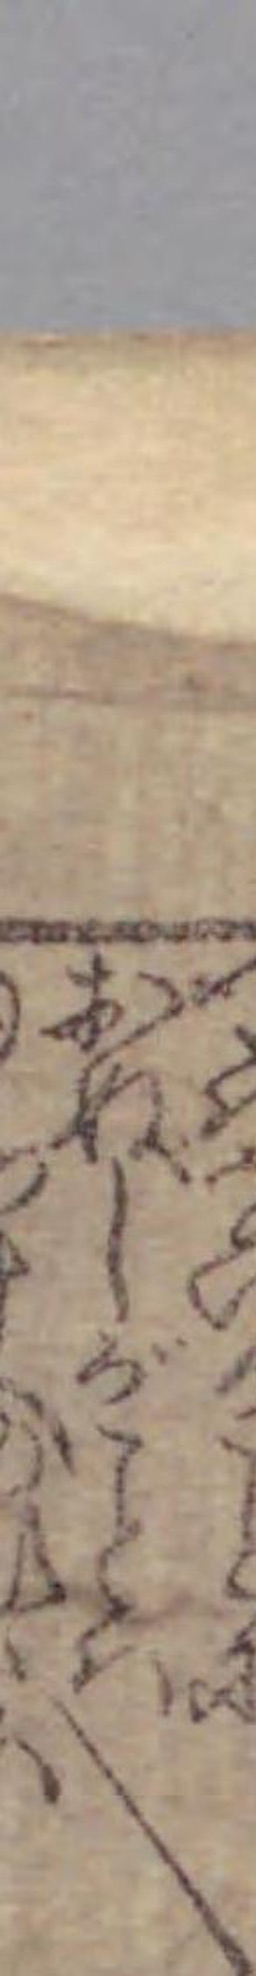おぬしがことは
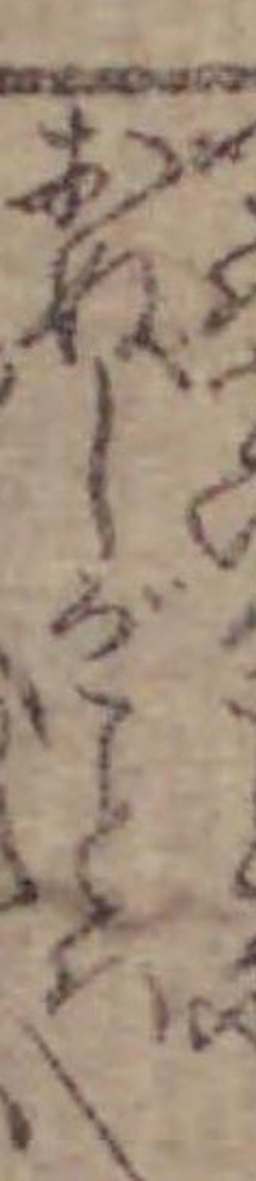おぬしがことは
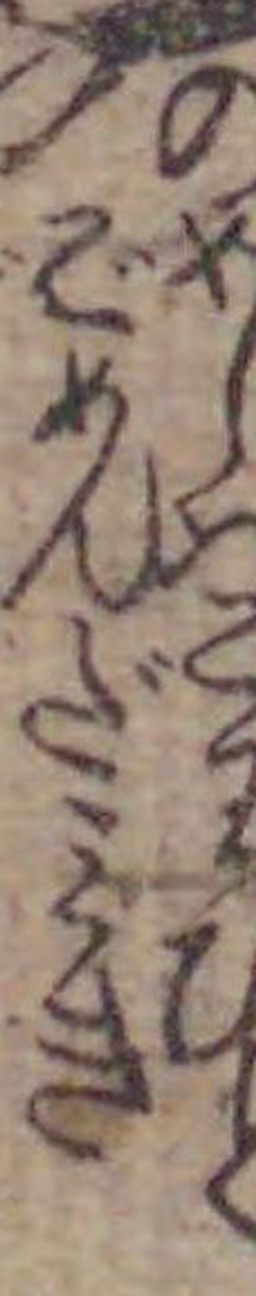ごめんだみき
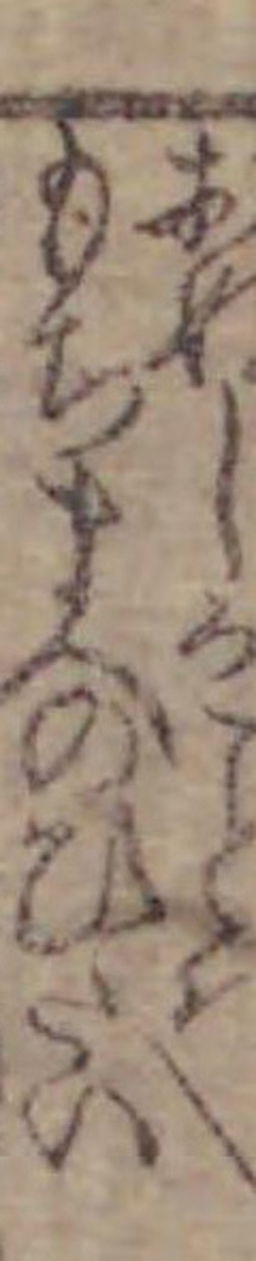もちまへのひたい
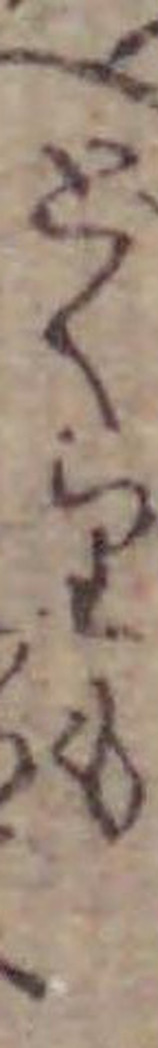どくりも
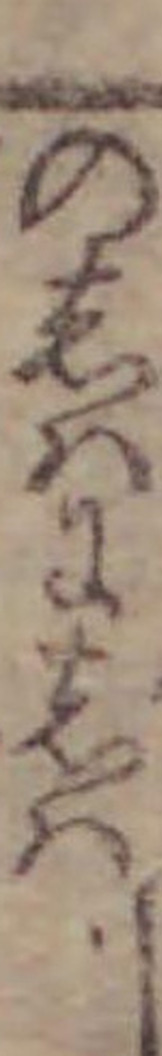のしはにしは
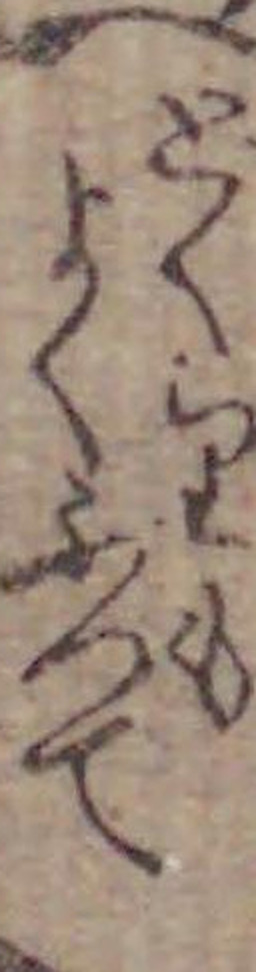よくふつて
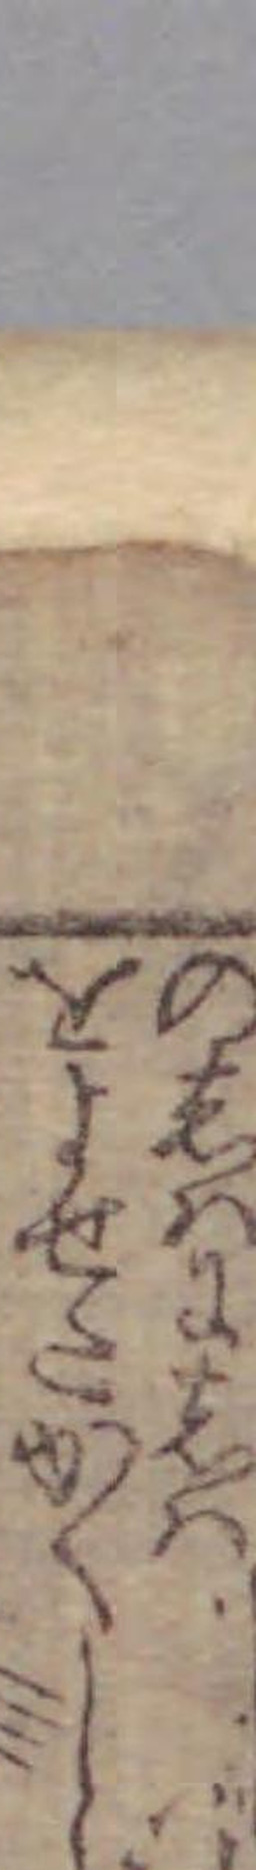をよせたかく
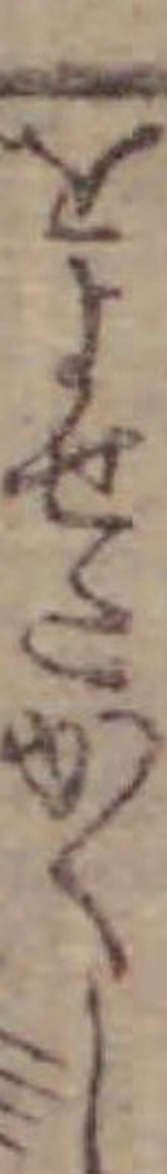をよせたかく
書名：即席耳学問 : 3巻
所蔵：国立国会図書館 National Diet Library, JAPAN
